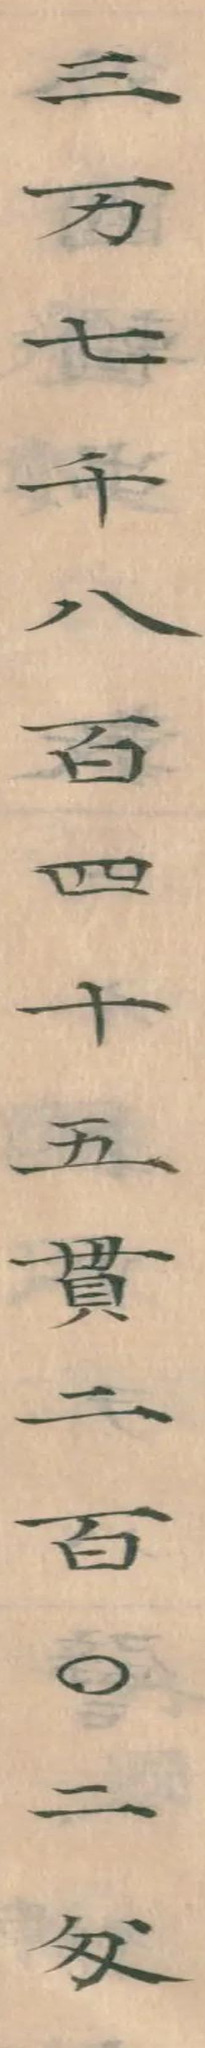三万七千八百四十五貫二百〇二匁
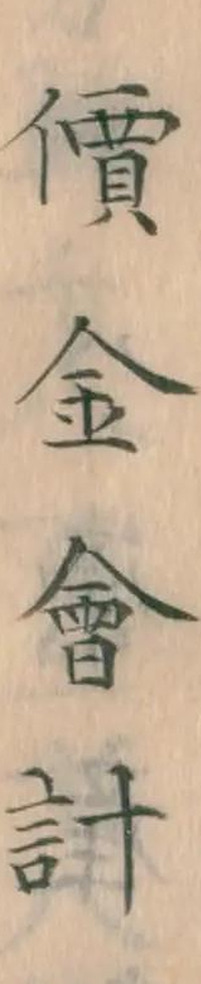価金会計
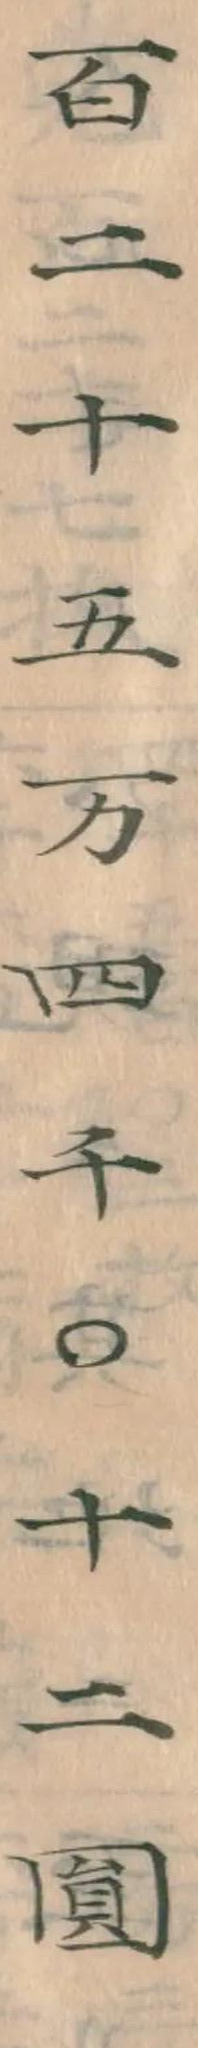百二十五万四千〇十二円
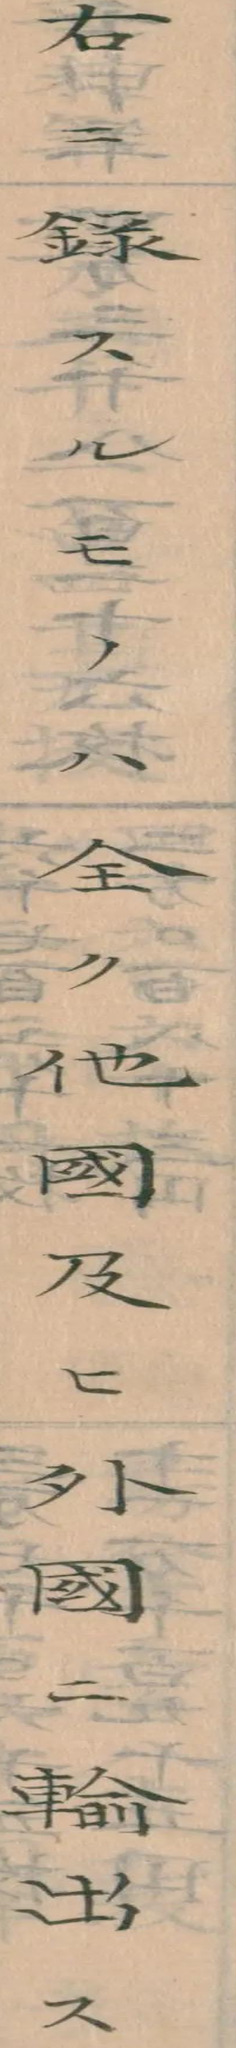右ニ録スルモノハ全ク他国及ヒ外国ニ輸出ス
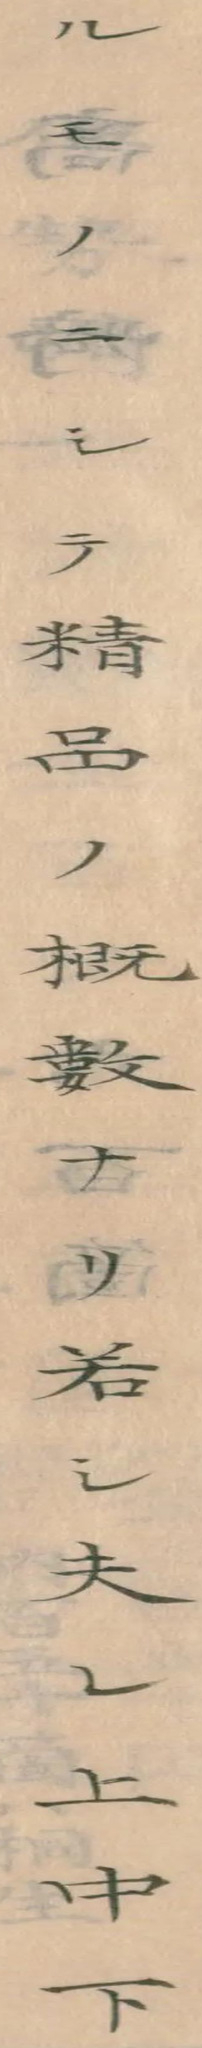ルモノニシテ精品ノ概数ナリ若シ夫レ上中下
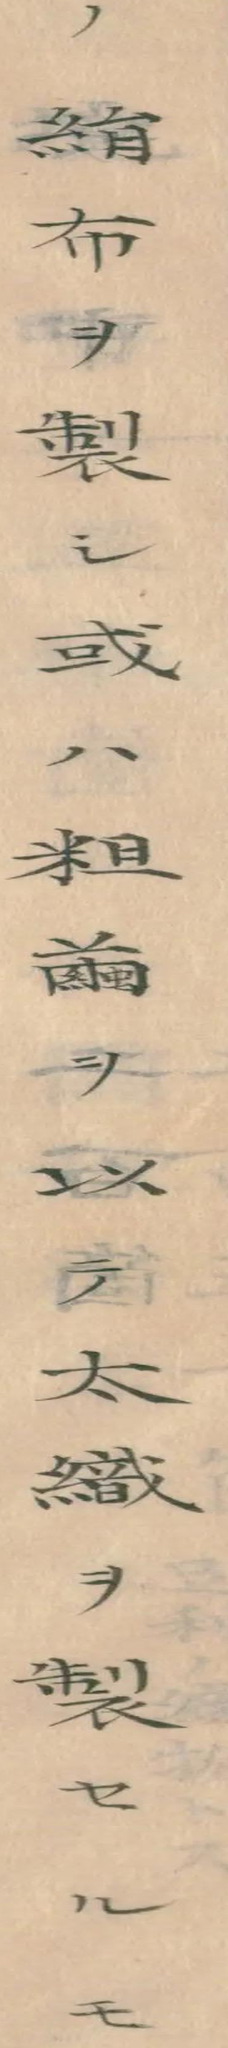ノ絹布ヲ製シ或ハ粗繭ヲ以テ太織ヲ製セルモ
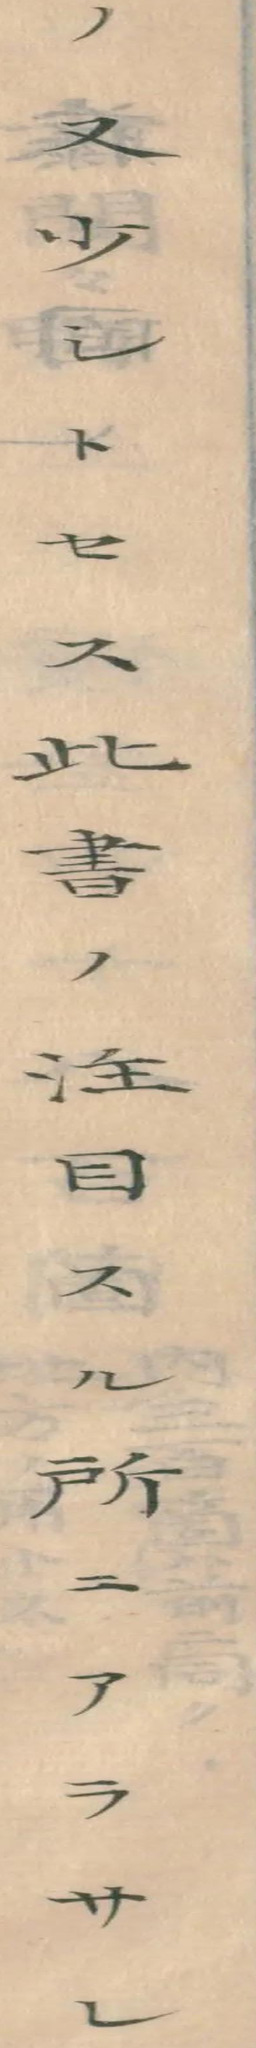ノ又少シトセス此書ノ注目スル所ニアラサレ
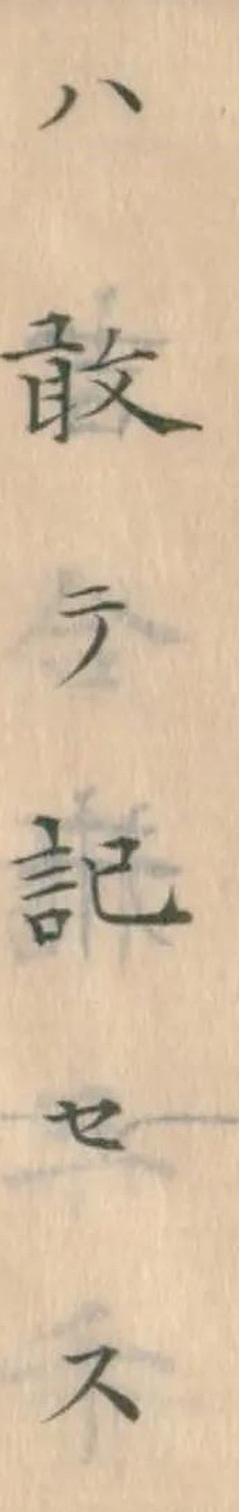ハ敢テ記セス
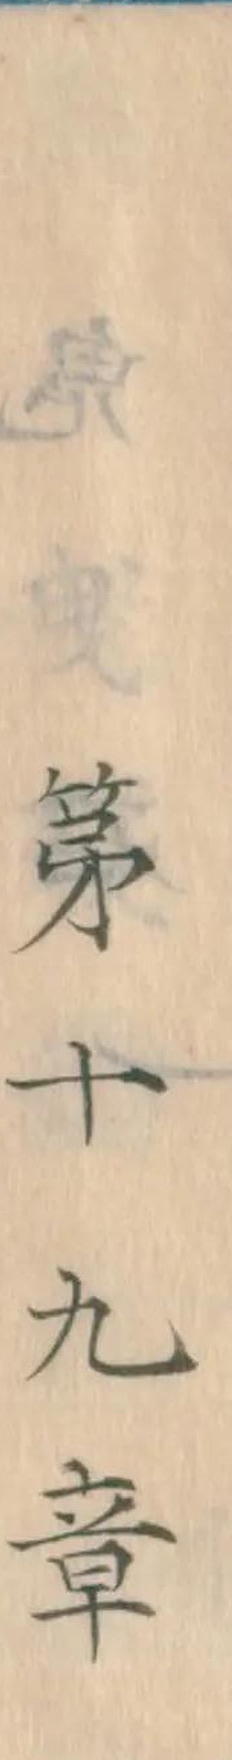第十九章
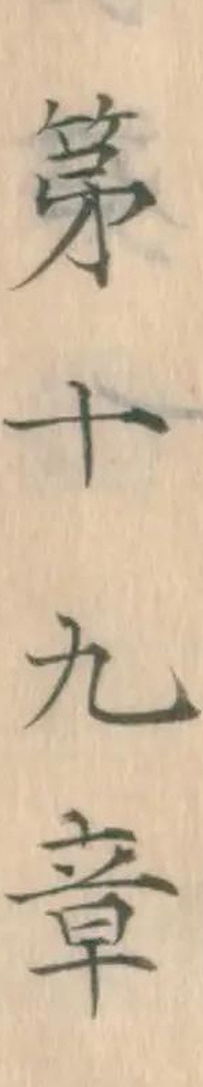第十九章
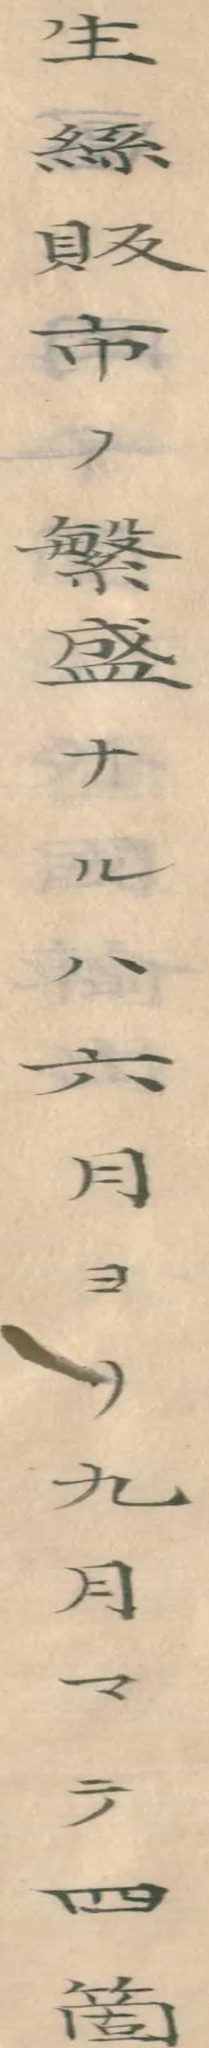生糸販市ノ繁盛ナルハ六月ヨリ九月マテ四箇
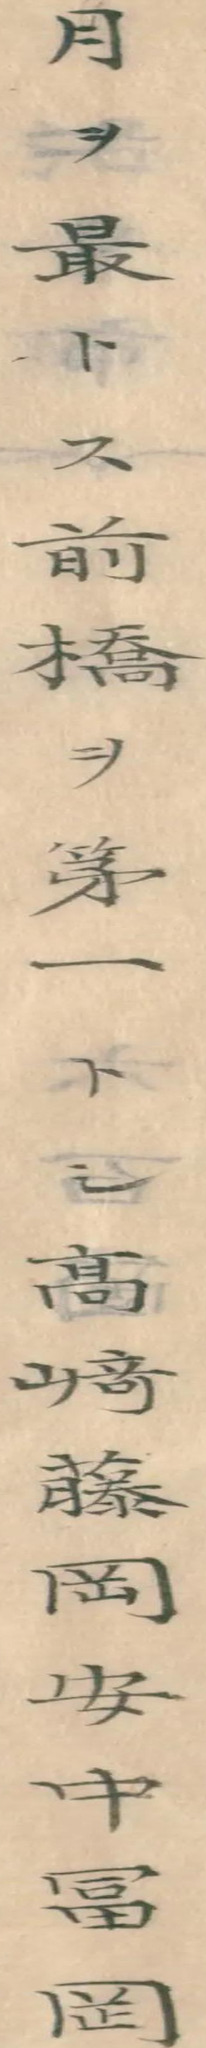月ヲ最トス前橋ヲ第一トシ高崎藤岡安中富岡
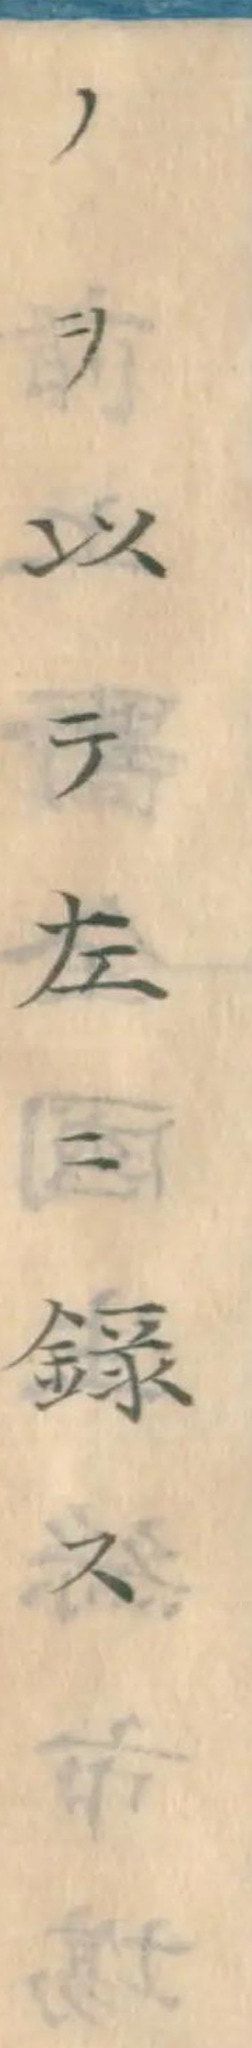ノヲ以テ左ニ録ス

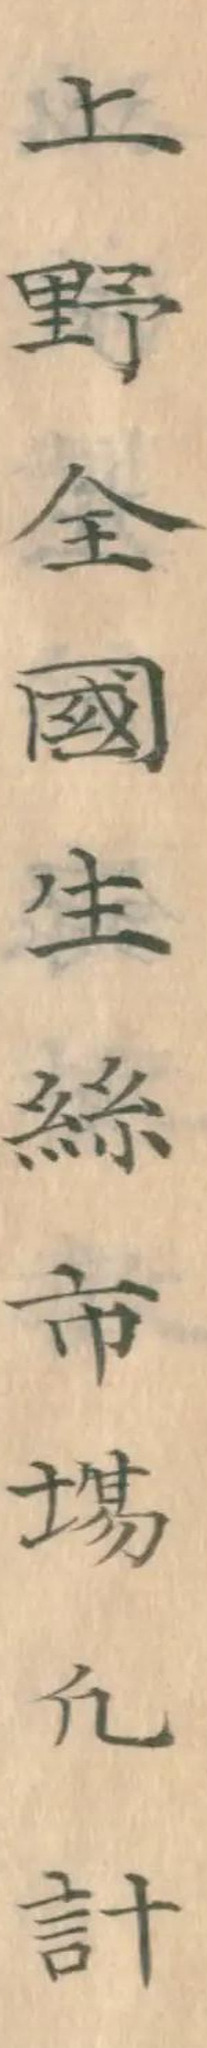上野全国生糸市場凡計
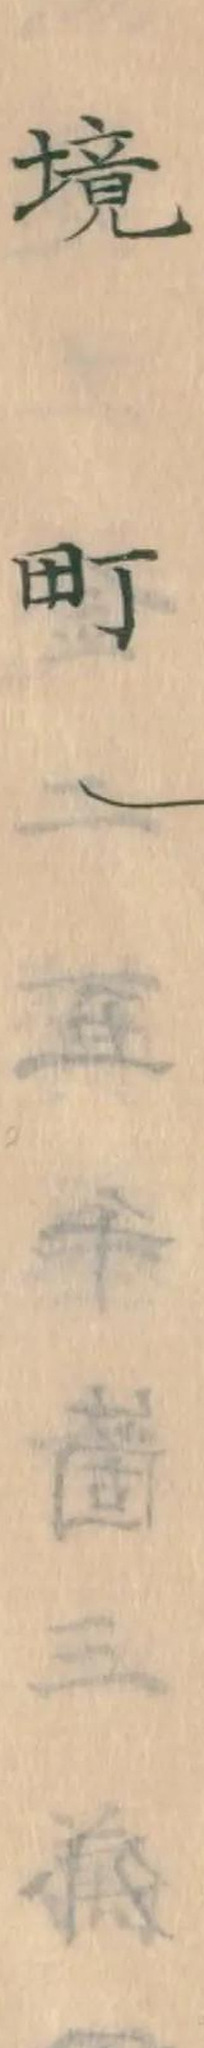境町┘
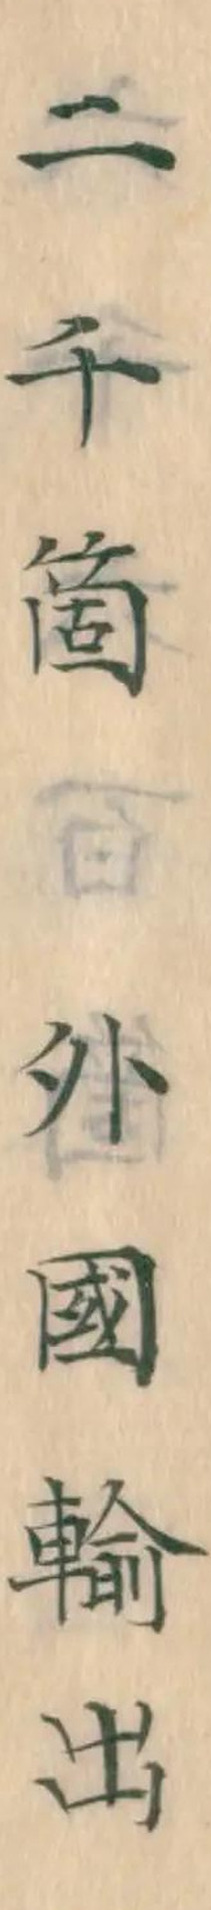二千箇外国輸出
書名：蚕桑集成
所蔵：国立国会図書館 National Diet Library, JAPAN
